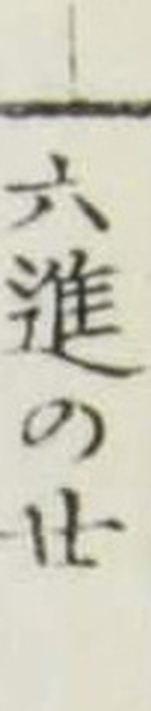六進の廿
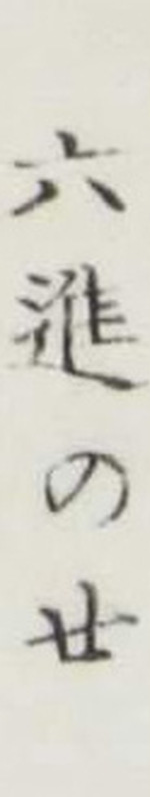六進の廿
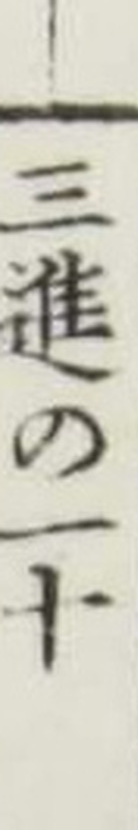三進の一十
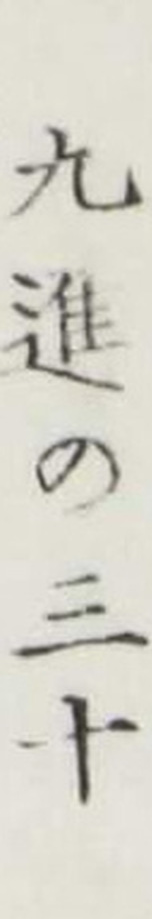九進の三十
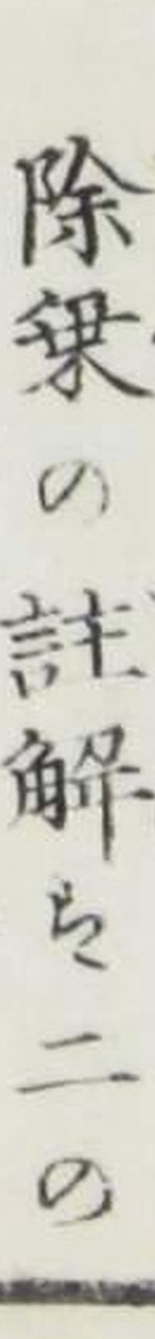除乗の註解は二の
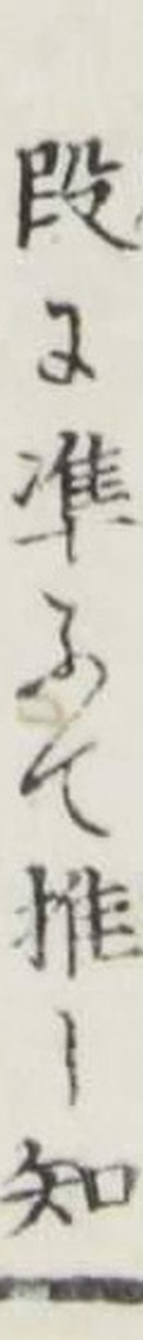段に準ふて推し知
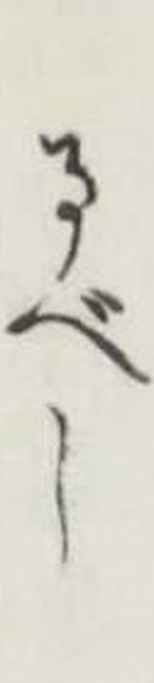るべし
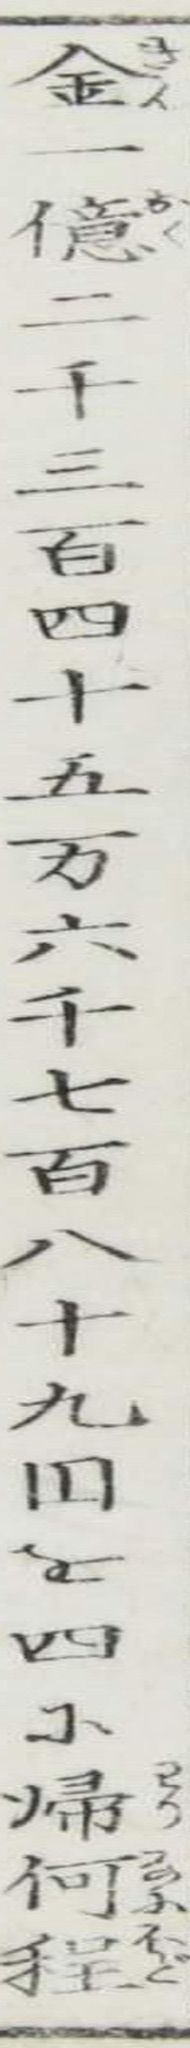金一億二千三百四十五万六千七百八十九円を四に帰何程
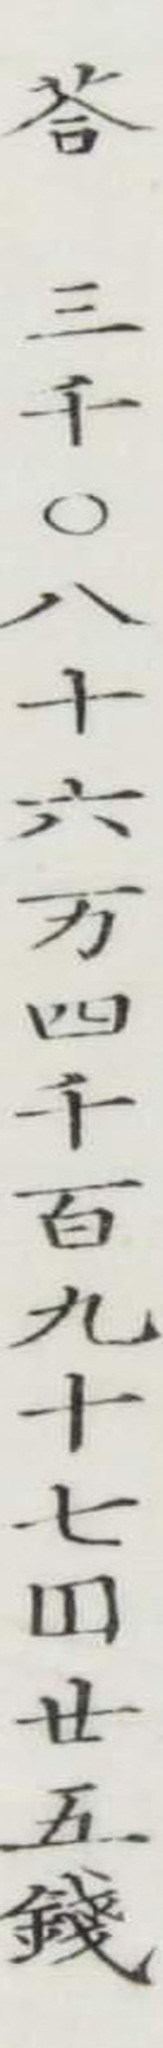答三千〇八十六万四千百九十七円廿五銭
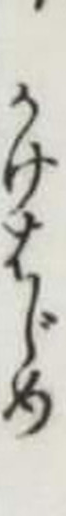わりはじめ
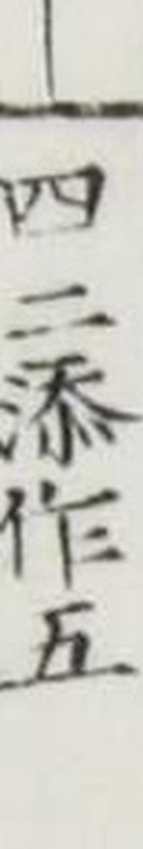四二添作五
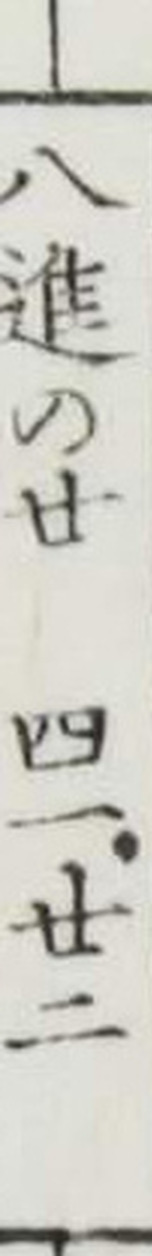八進の廿四七．廿八
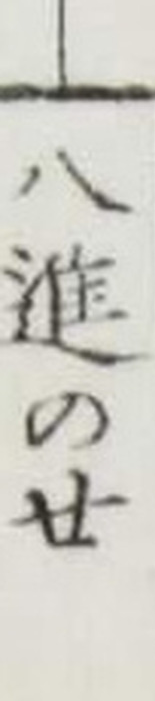八進の廿
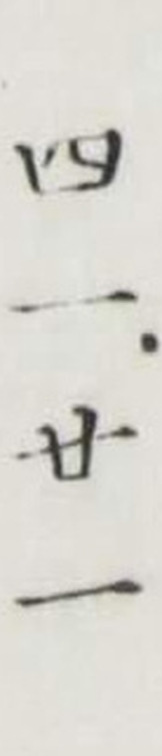四一．廿一
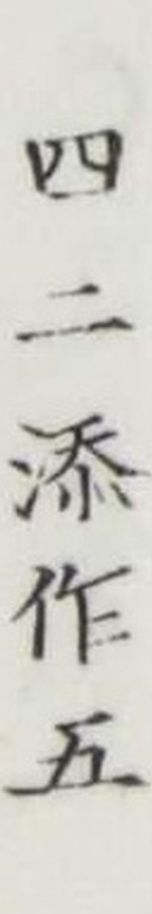四二添作五
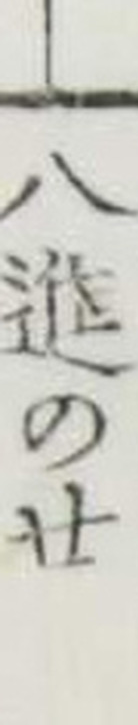八進の廿
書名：明治小學塵劫記 卷1
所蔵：東京学芸大学教育コンテンツアーカイブ
